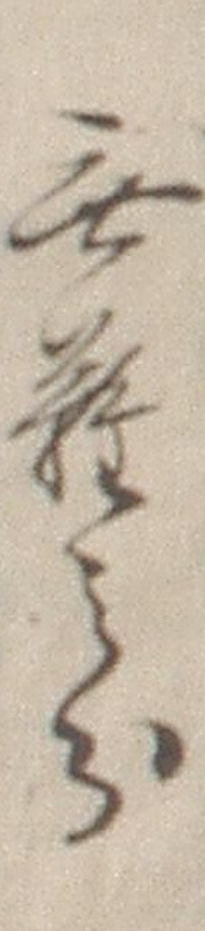無難之分
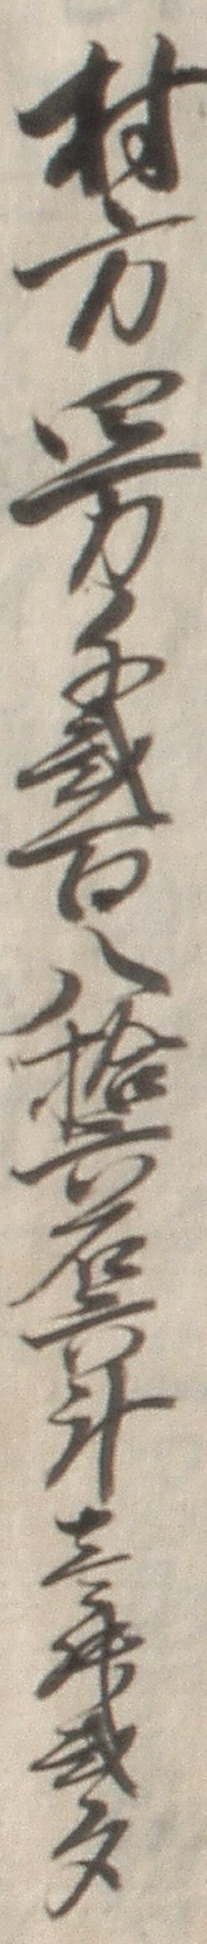村方四万千弐百八拾六石六斗壱升弐勺
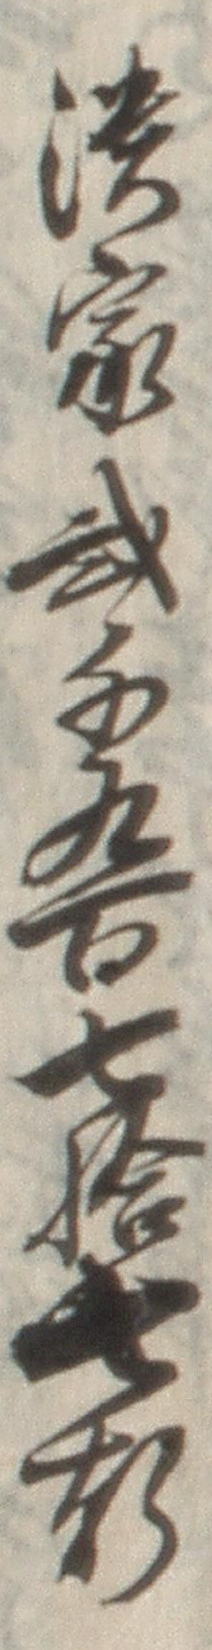潰家弐千九百七拾七軒

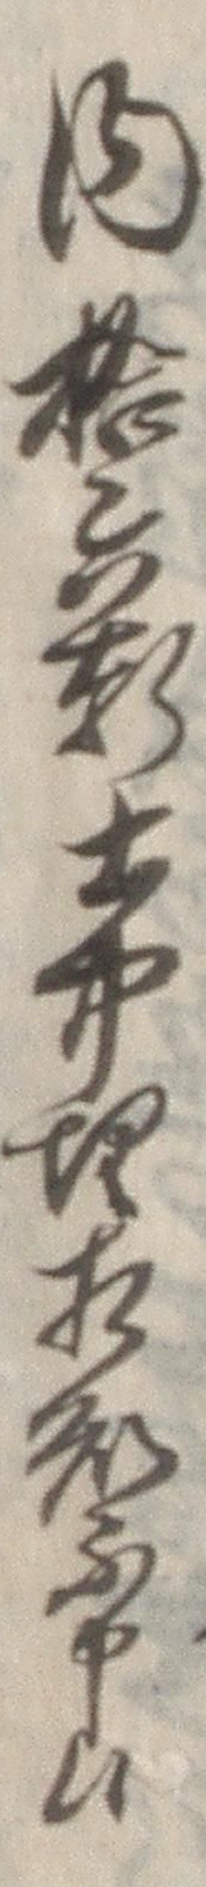内拾六軒土中埋相知不申候
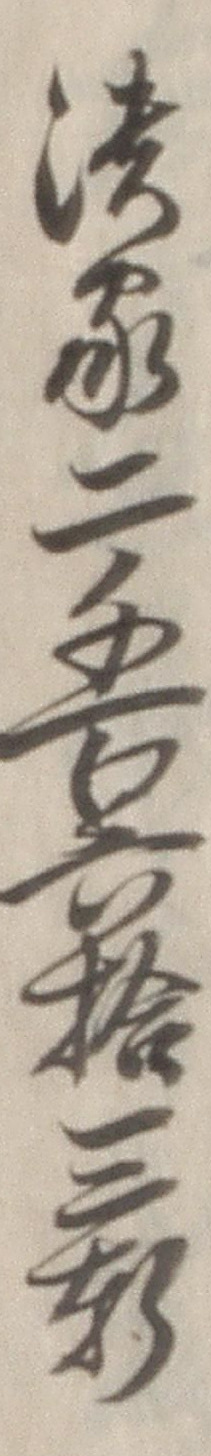潰家二千百六拾三軒
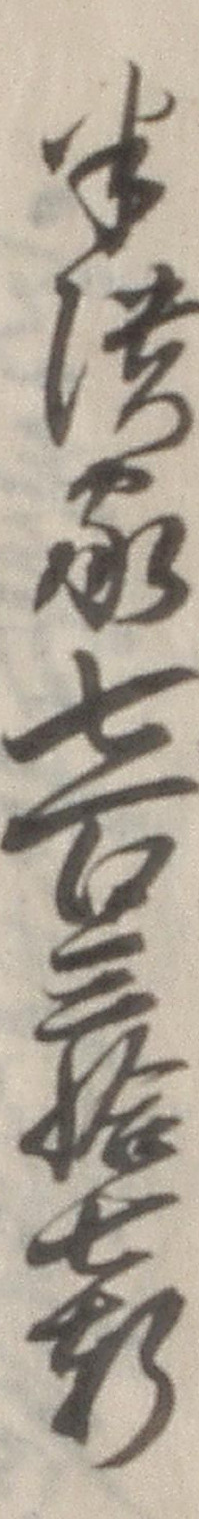半潰家七百三拾七軒
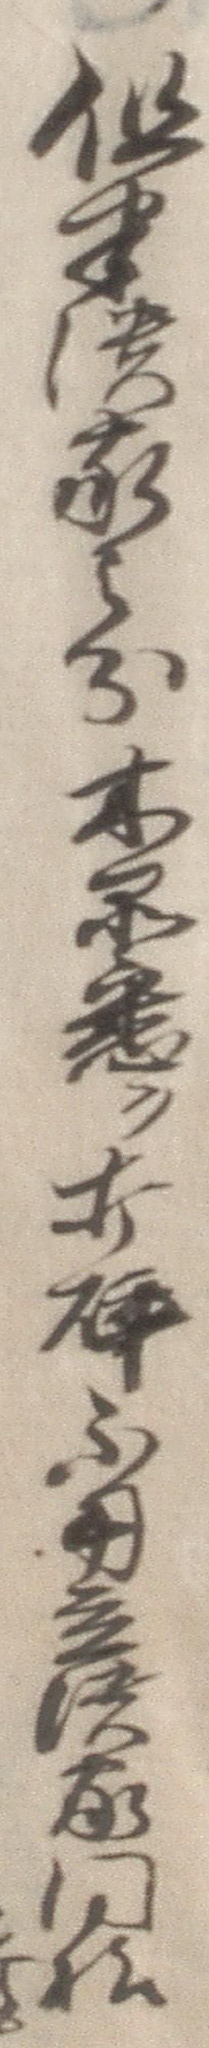但半潰家之分木品悉ク打砕不用立潰家同様御座候
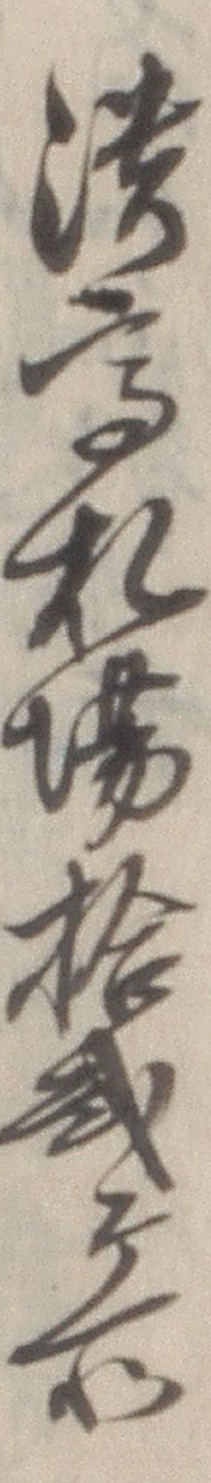潰高札場拾弐ヶ所
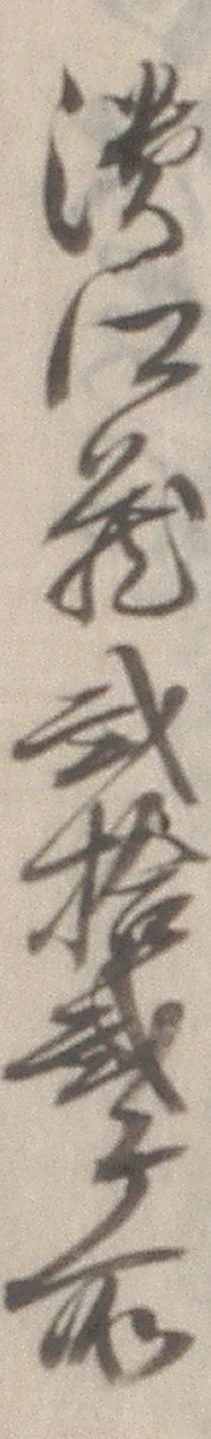潰郷蔵弐拾弐ヶ所
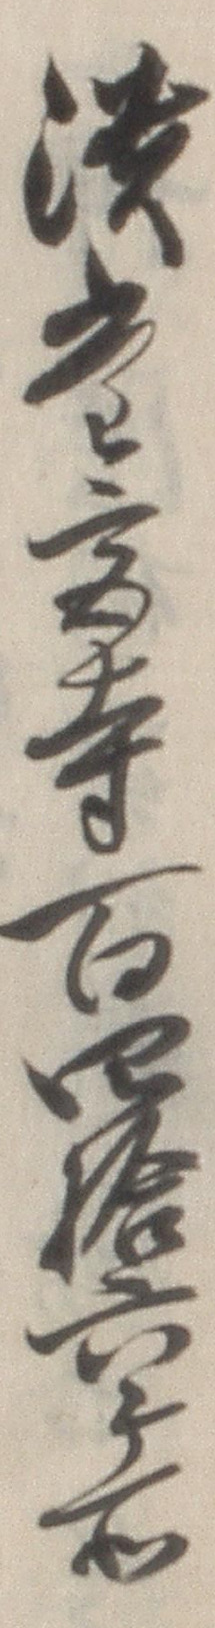潰堂宮寺百四拾六ヶ所
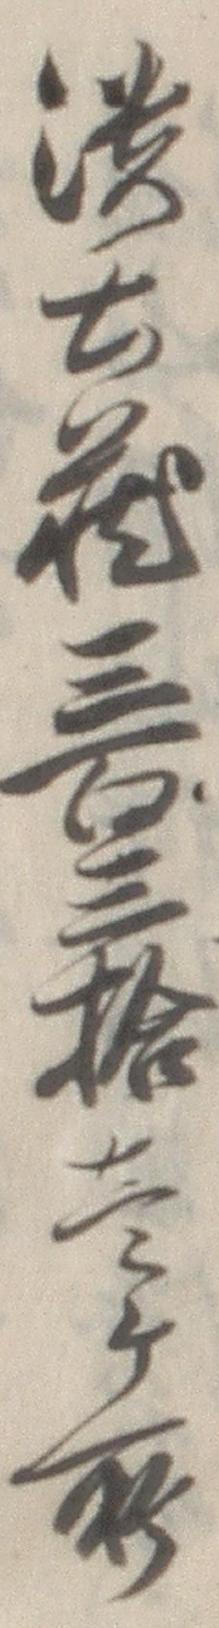潰土蔵三百三拾壱ヶ所
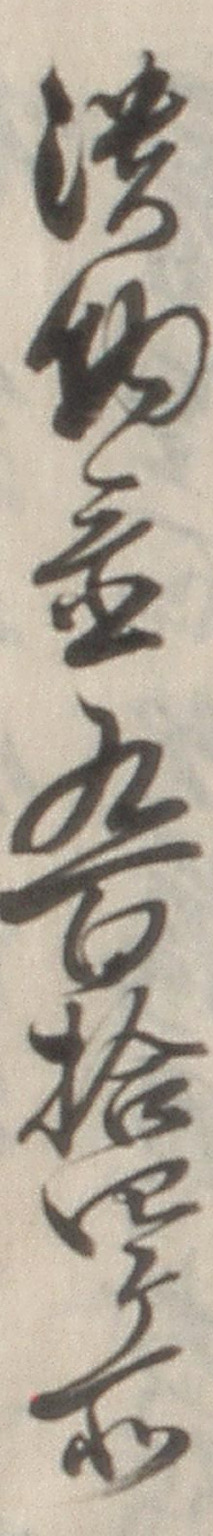潰物置九百拾四ヶ所
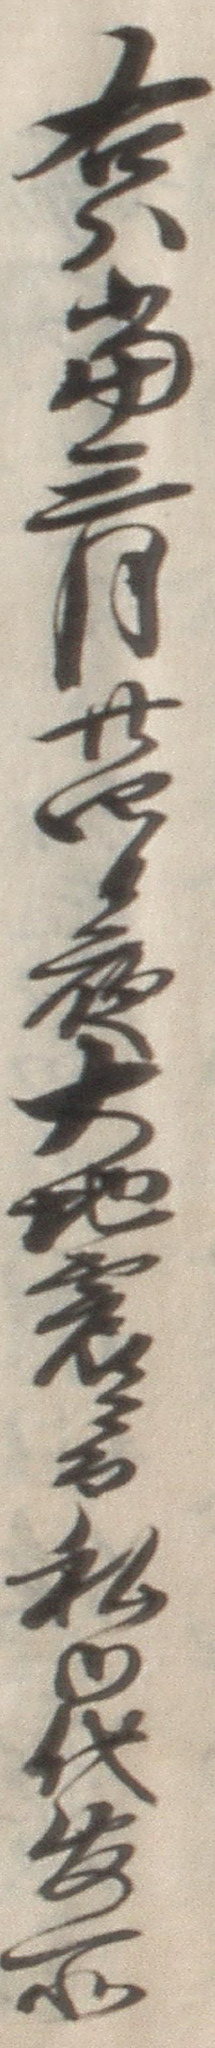右ハ当三月廿四日夜大地震二而私御代官所
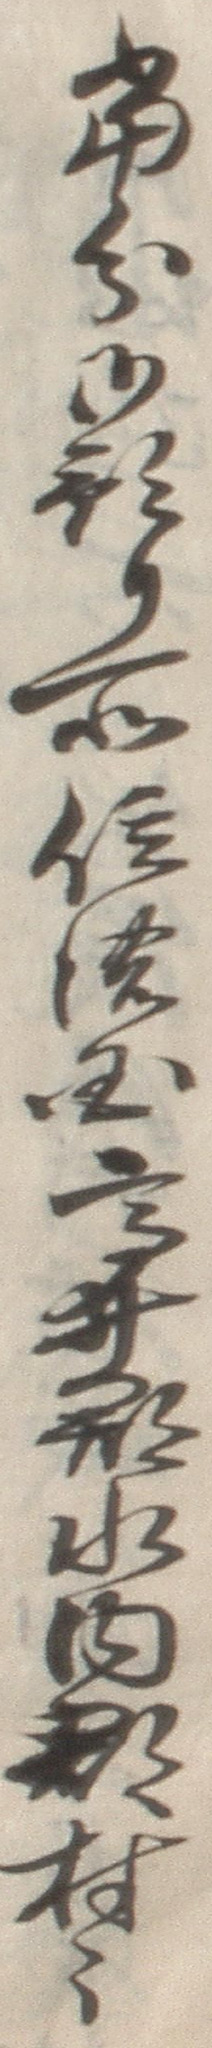当分御預り所信濃国高井郡水内郡村々
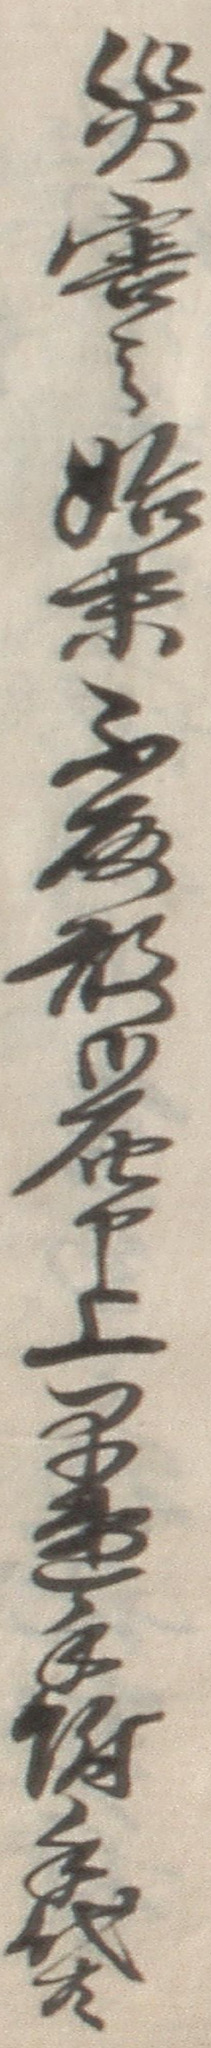災害之始末不取敢御届申上早速手附手代共
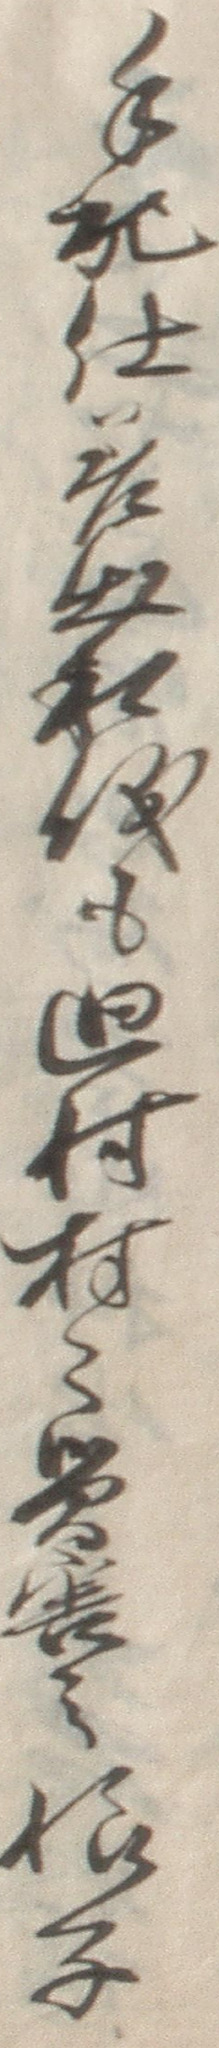手配仕御差出私儀も廻村村々災害之様子
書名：信州地震一件
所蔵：東京大学地震研究所図書室 Earthquake Research Institute Library, The University of Tokyo, JAPAN
